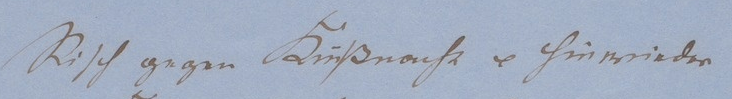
Risch gegen Küßnacht & hirwieder
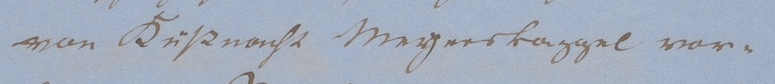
von KüßnachtMeyerskappel vor-
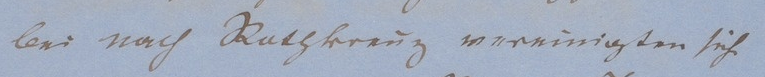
bei nach Rothkreuz vereinigten sich
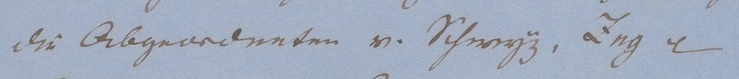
die Abgeordneten v. Schwyz, Zug &
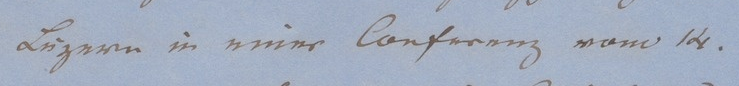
Luzern in einer Conferenz vom 14.
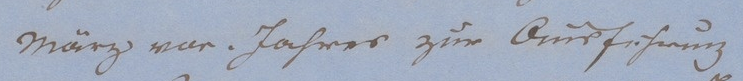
März vor. Jahres zur Ausführung
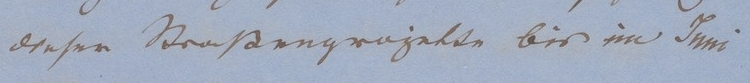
dieser Straßenprojekte bis im Juni
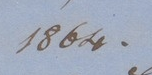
1864.
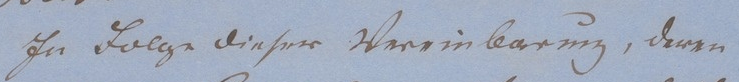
In Folge dieser Vereinbarung, deren
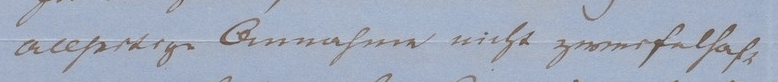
allseitige Annahme nicht zweifelhaft
